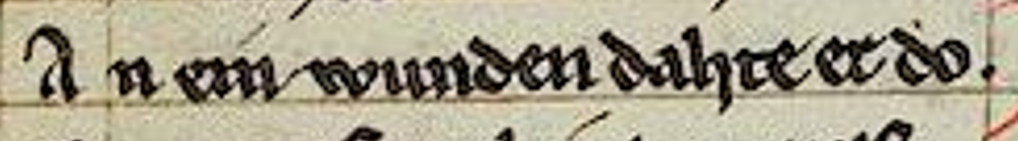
An ein wunden dahte er do.
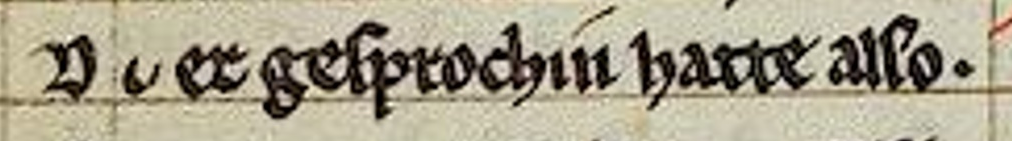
D(az) er geſprochin hatte alſo.
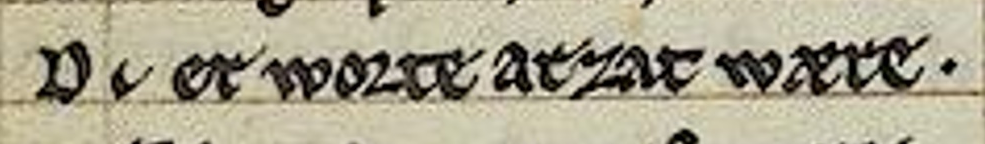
D(az) er worte arzat w[ae]re.
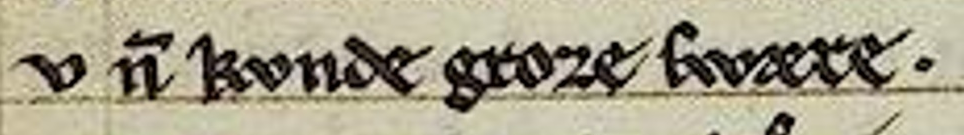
Vn(d) kvnde groze ſw[ae]re.
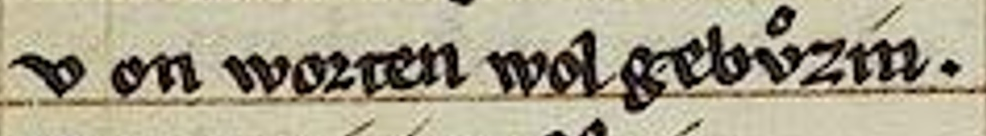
Von worten wol gebv°ozin.
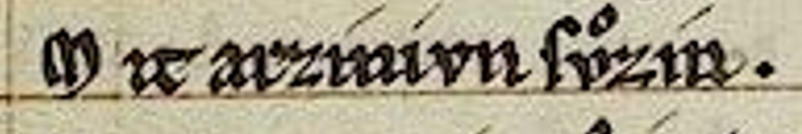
Mit arzinivn ſv°ozin.
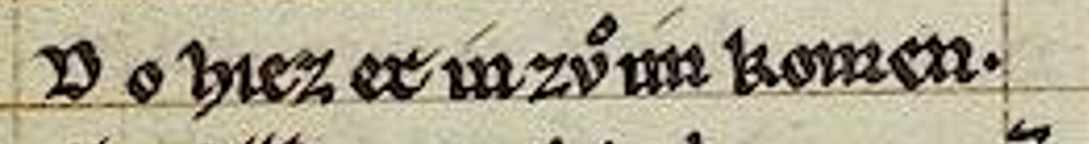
Do hiez er in zv°o im komen.
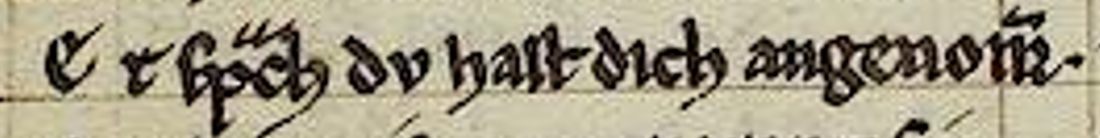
Er sp(ra)ch dv haſt dich angenom(n).
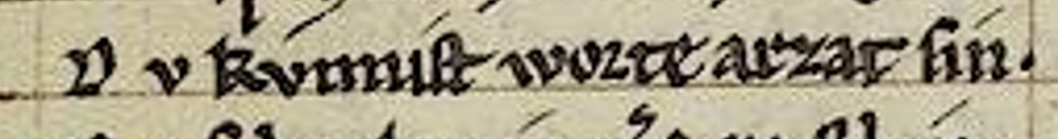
Dv kvnniſt worte arzat ſin.
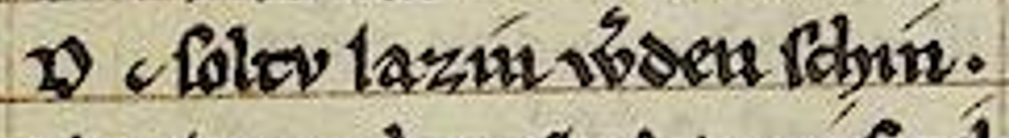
D(az) ſoltv lazin w(er)den ſchin.
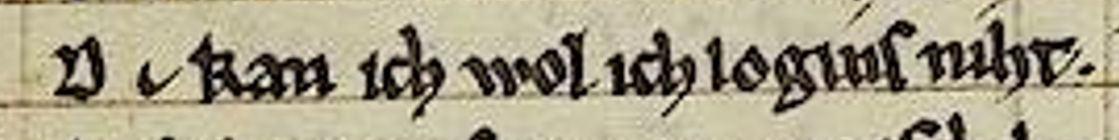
D(az) kan ich wol ich loginſ niht.
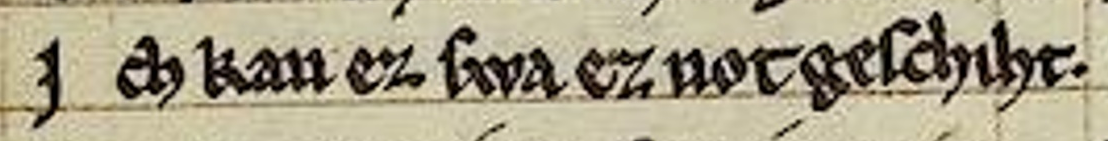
Ich kan ez ſwa ez not geſchiht.
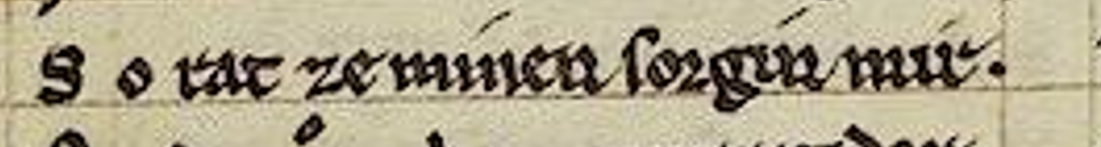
So rat ze minem ſorgin mir.
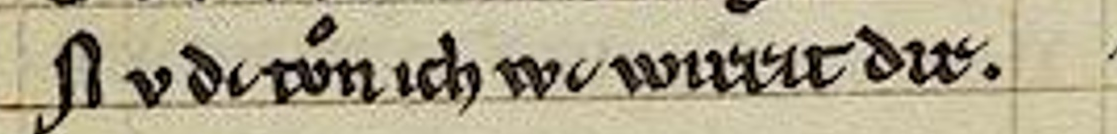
Nv d(az) tv°on ich w(az) wirrit dir.
